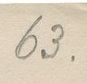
G.
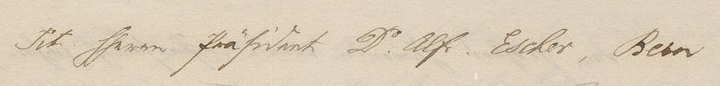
Tit. HHerrn Präsident Dr Alfr. Escher, Bern
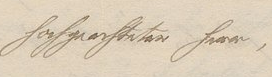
Hochgeachteter Herr,
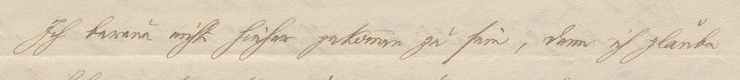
Ich bereue nicht hieher gekommen zu sein, denn ich glaube
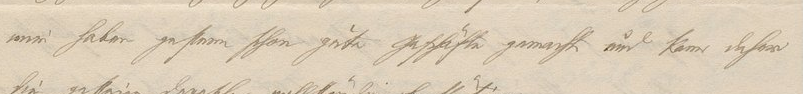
wir haben gestern schon gute Geschäfte gemacht und kann daher
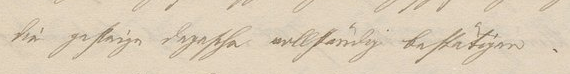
die gestrige Depesche vollständig bestätigen.
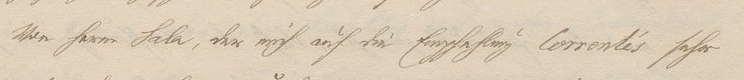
Von Herrn Sala, der mich auf die Empfehlung Correntis sehr
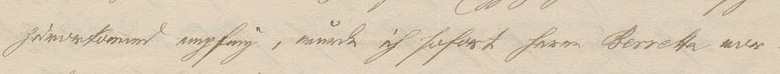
zuvorkommend empfing, wurde ich sofort Herrn Berretta vor-
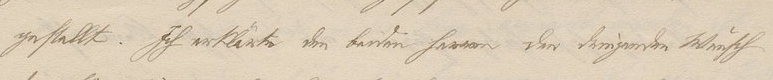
gestellt. Ich erklärte den beiden Herren den dringenden Wunsch
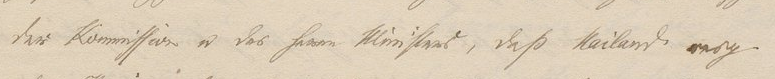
der Kommission & des Herrn Ministers, daß Mailand resp.
